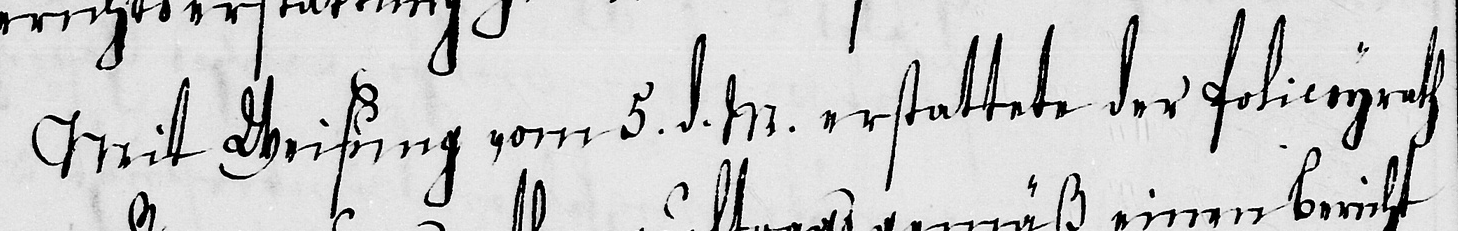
Mit Weisung vom 5. d. M. erstattete der Policeyrath
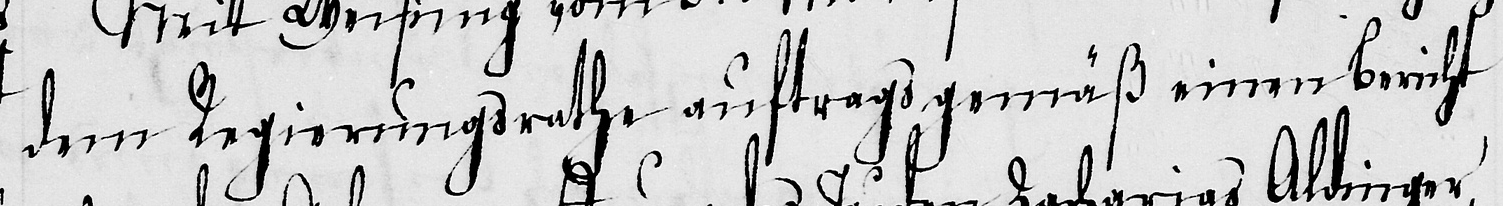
dem Regierungsrathe auftragsgemäß einen Bericht
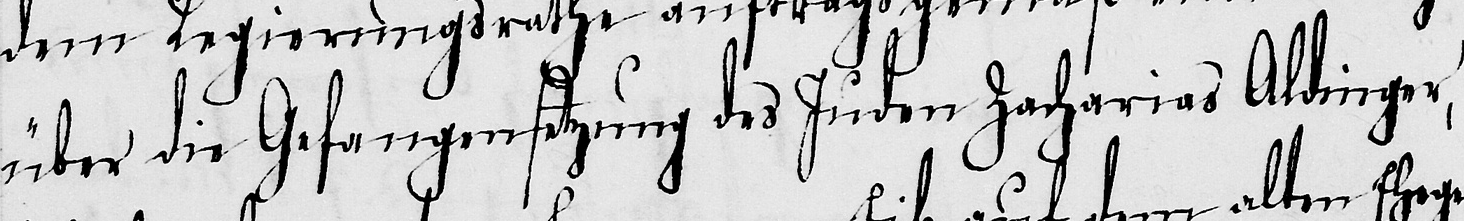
über die Gefangensetzung des Juden Zacharias Aldinger,
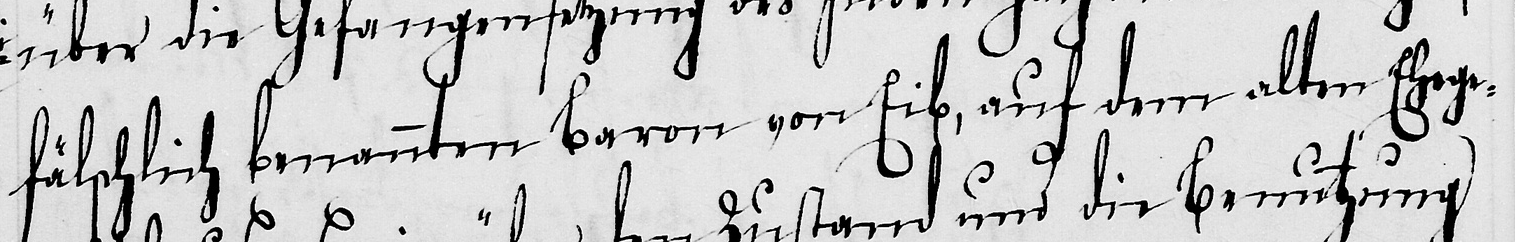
fälschlich benannten Baron von Eib, auf dem alten Ehege¬
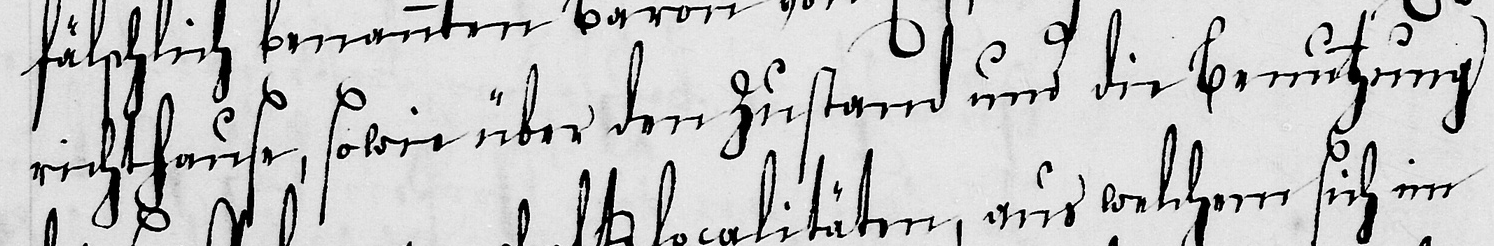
richthause, sowie über den Zustand und die Benutzung
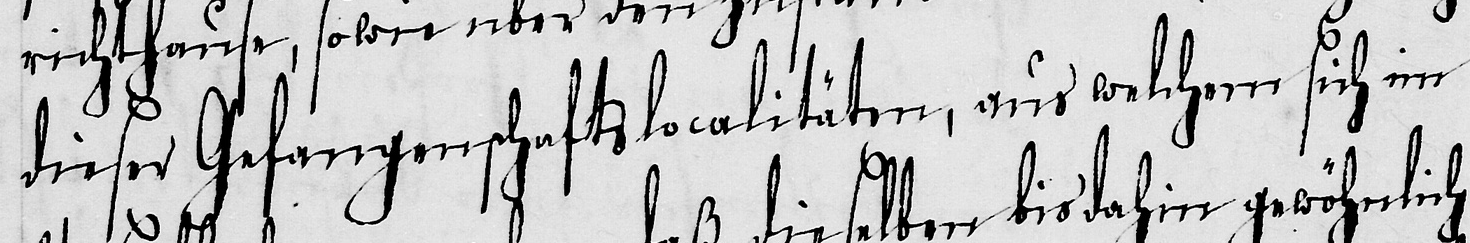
dieser Gefangenschaftslocalitäten, aus welchem sich im
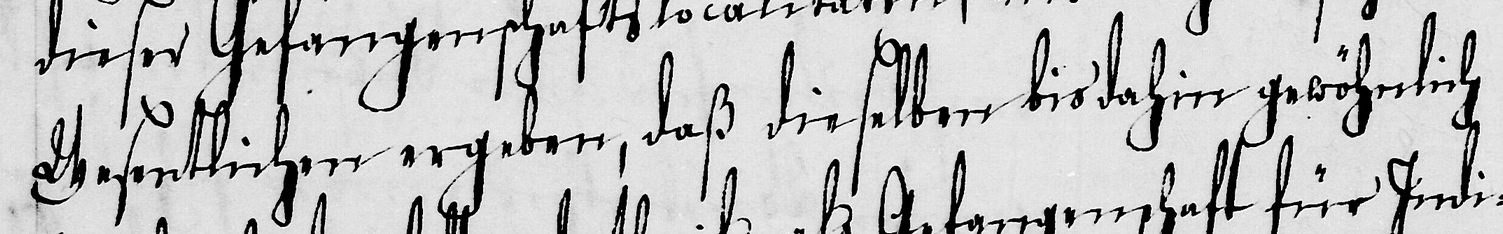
Wesentlichen ergeben, daß dieselben bis dahin gewöhnlich
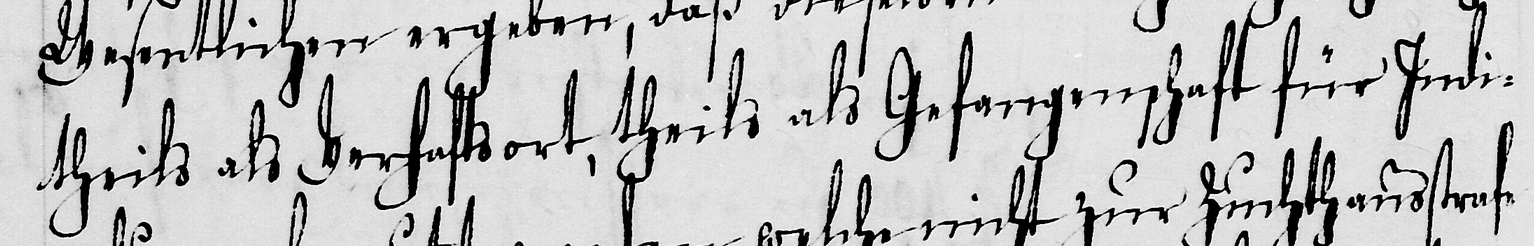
theils als Gefangenschaft für Indi¬
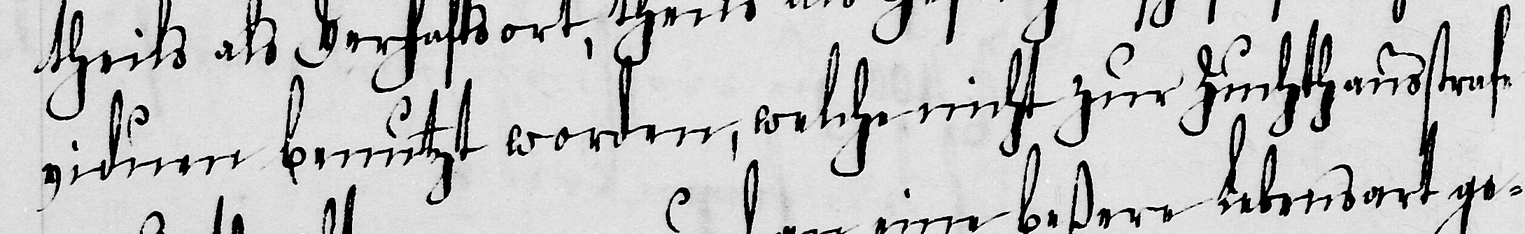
viduen benutzt worden, welche nicht zur Zuchthausstr¬
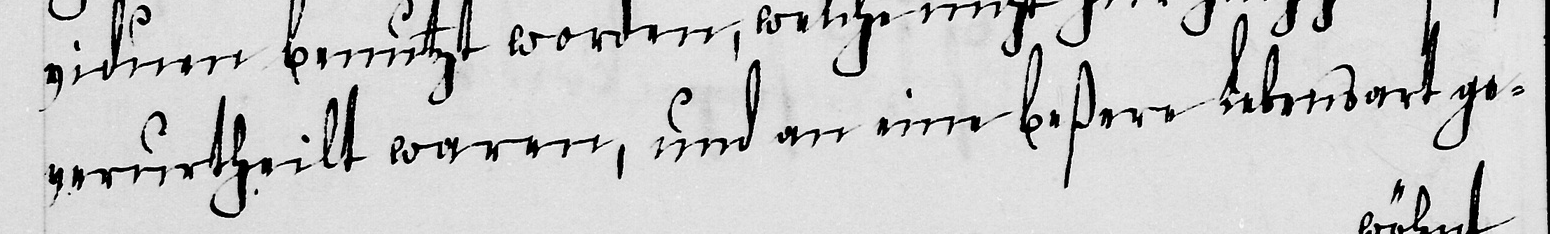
verurtheilt waren, und an eine beßere Lebensart ge-
